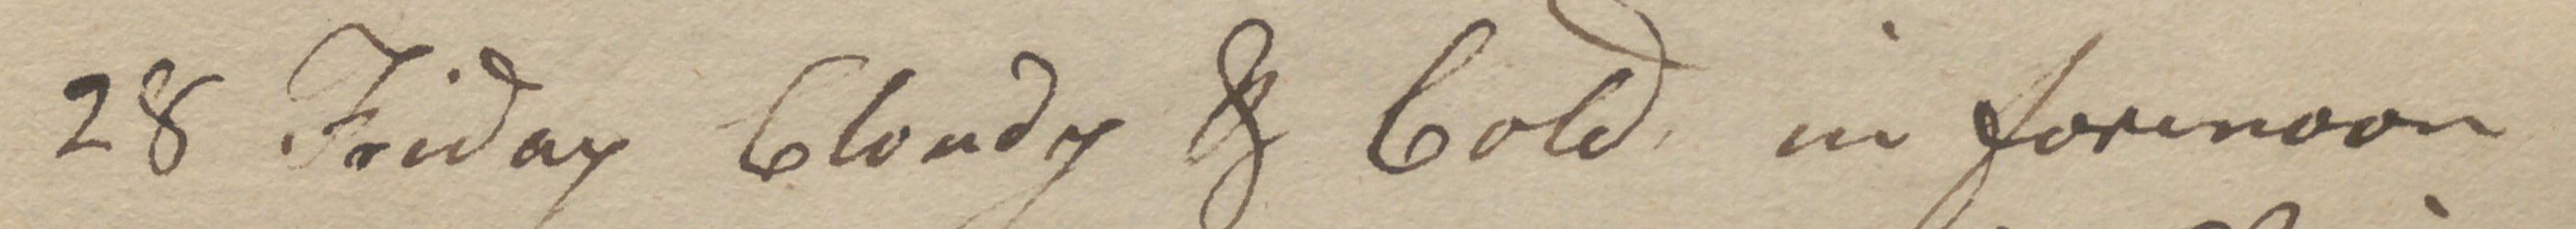28 Friday Cloudy & Cold. in forenoon
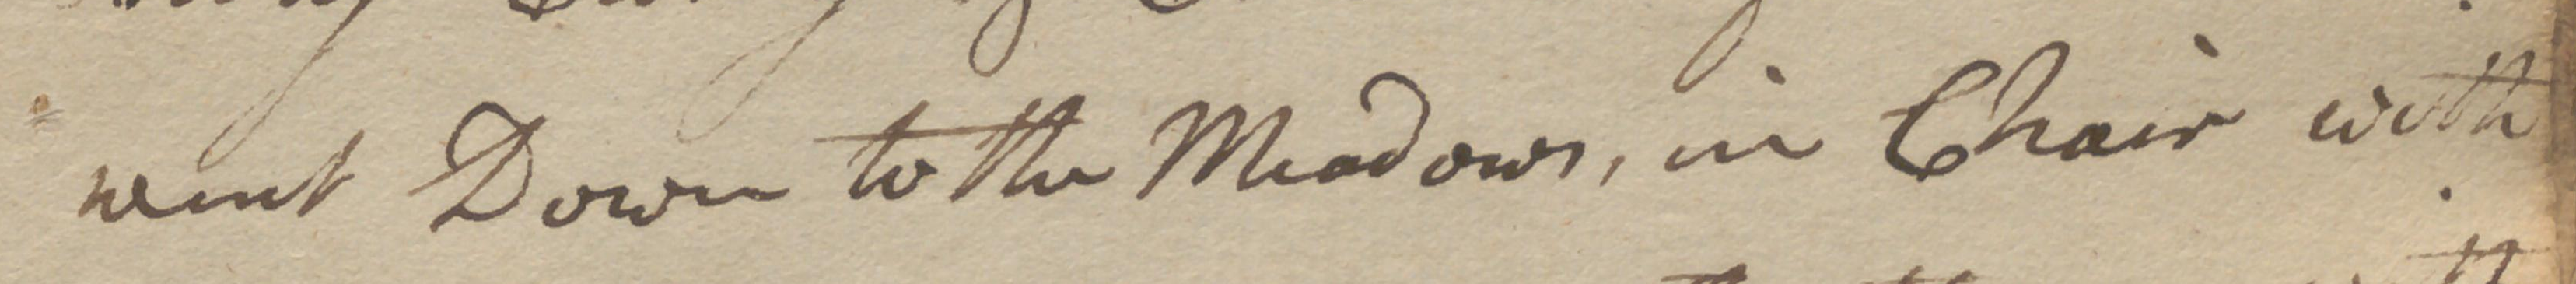went Down to the Meadows, in Chair with
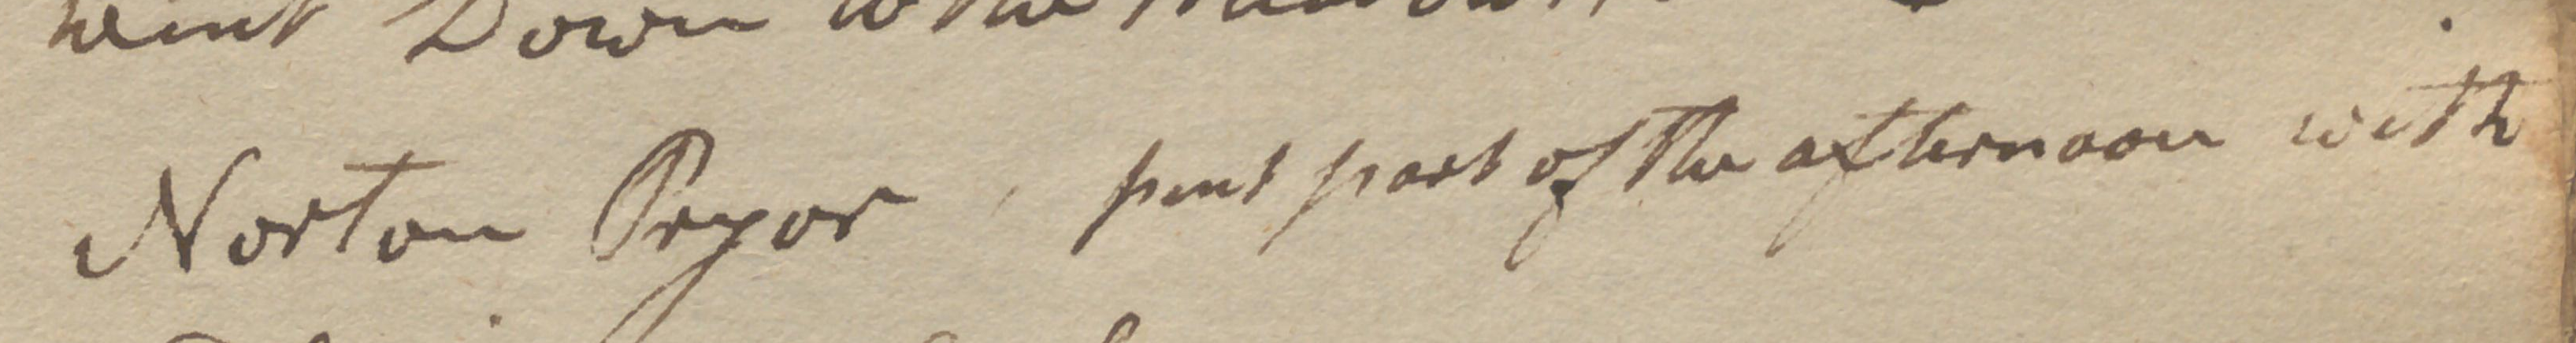Norton Pryor pent part of the afternoon with
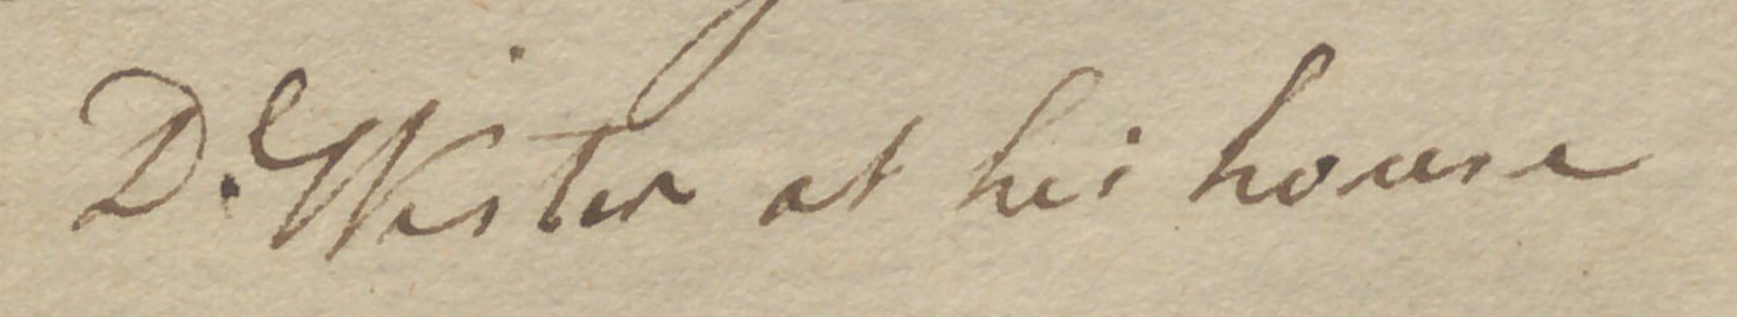D^l. Wister at his house
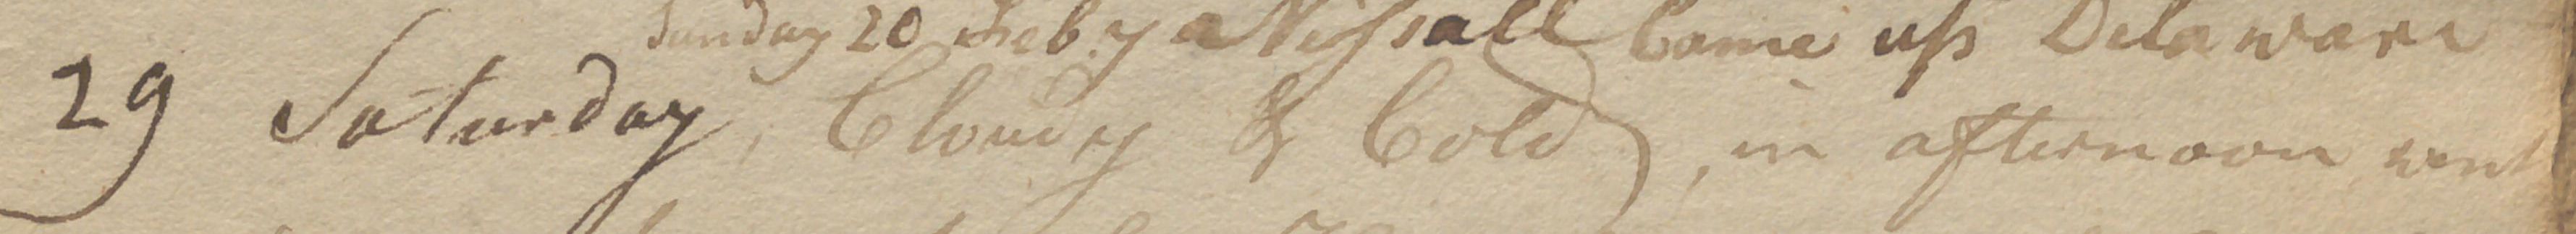29 Saturday, Cloudy & Cold, in afternoon went
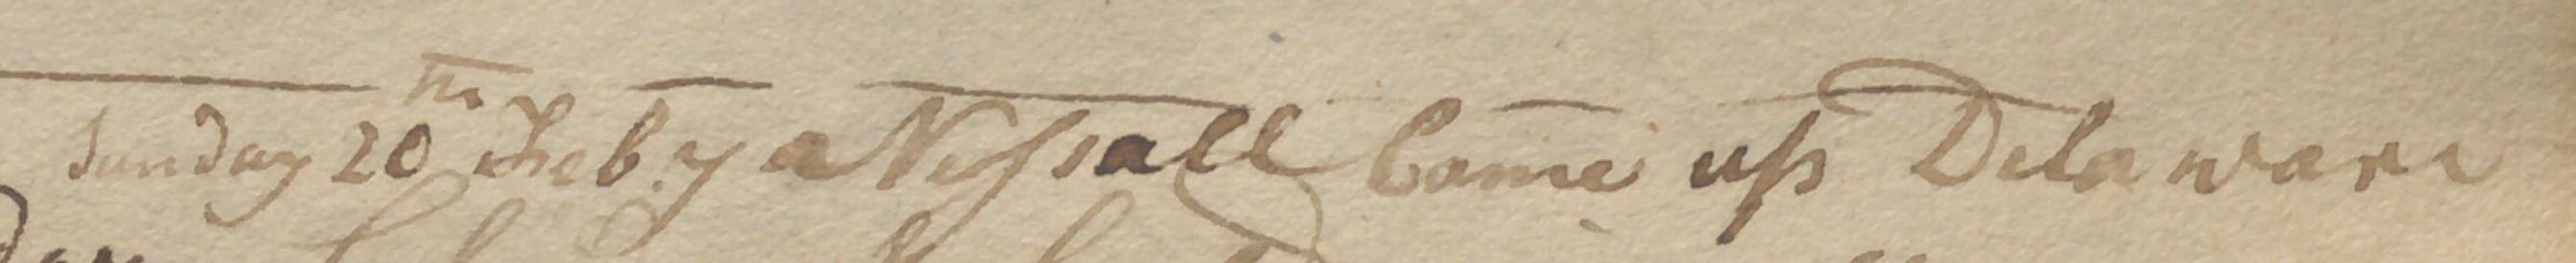Sunday 10^th. Feb^y. A Vessall Came up Delaware
